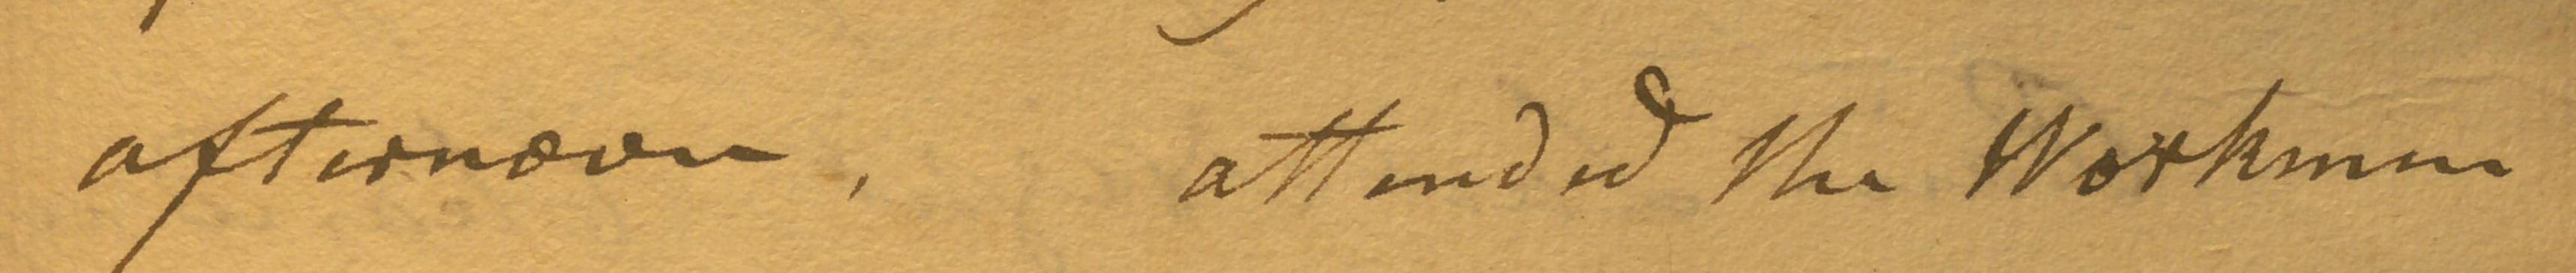afternoon, attended the Workmen
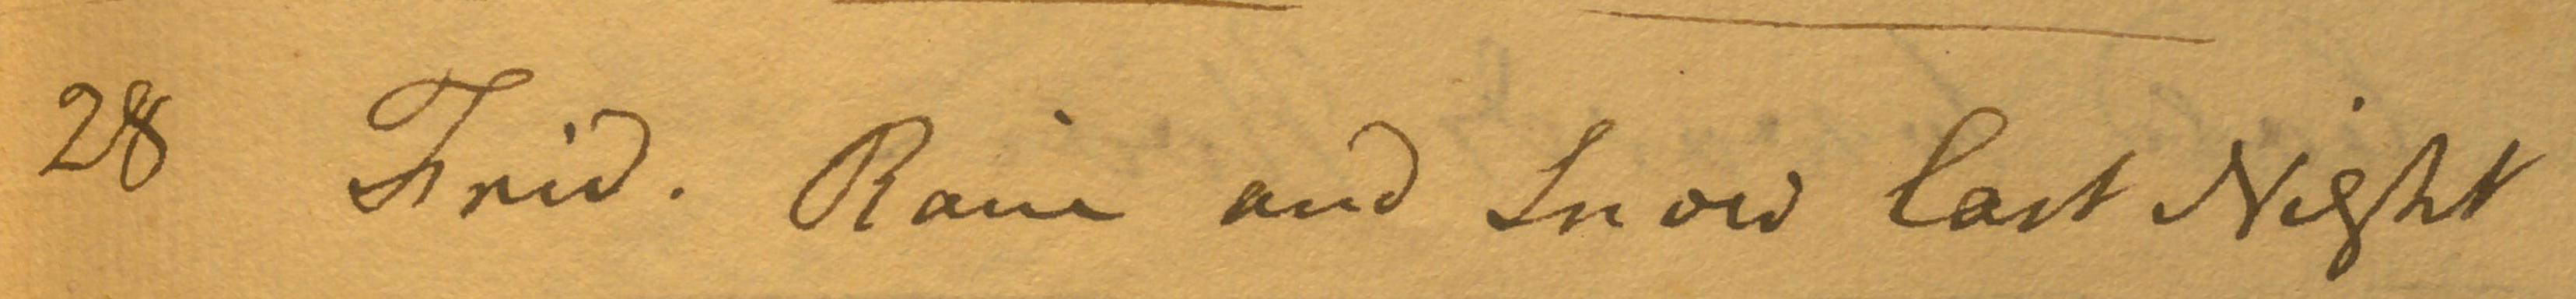28 Frid. Rain and Snow last Night
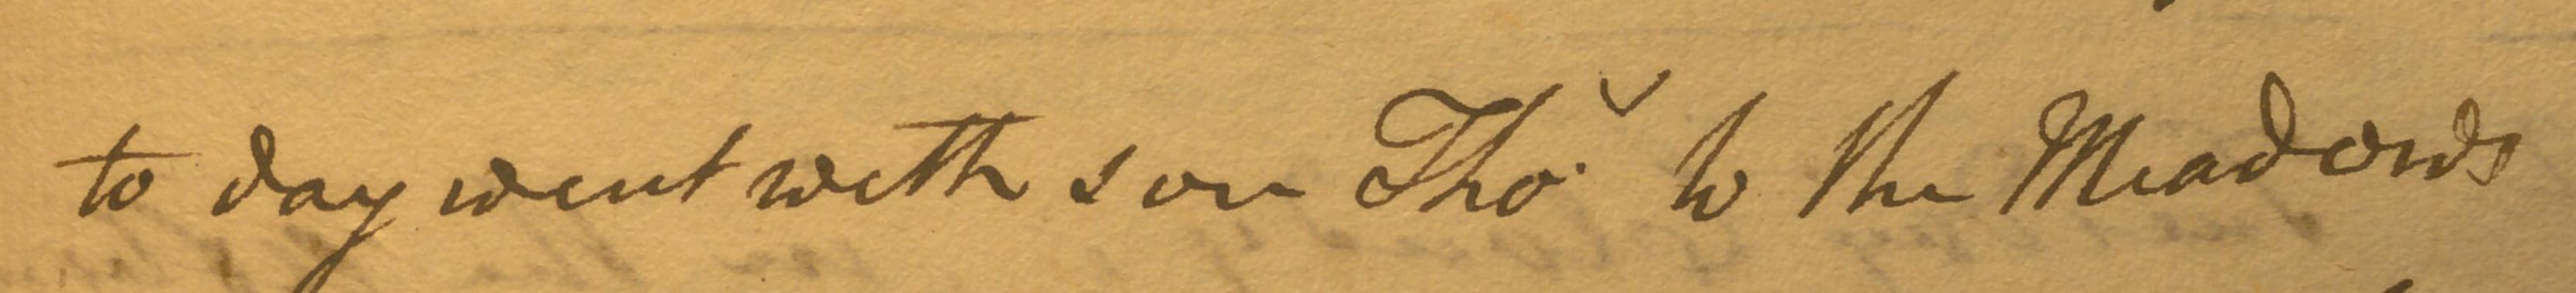to day went with son Tho^s to the Meadows
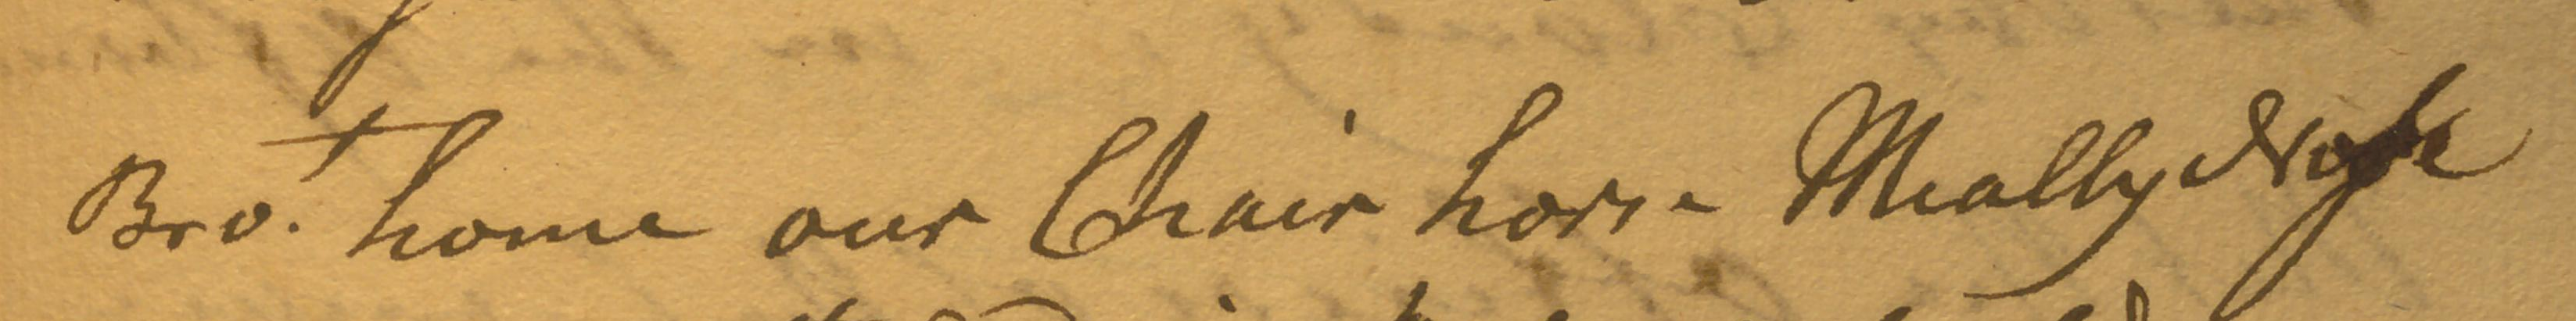Bro^t. home our Chair horse Meally Nefe
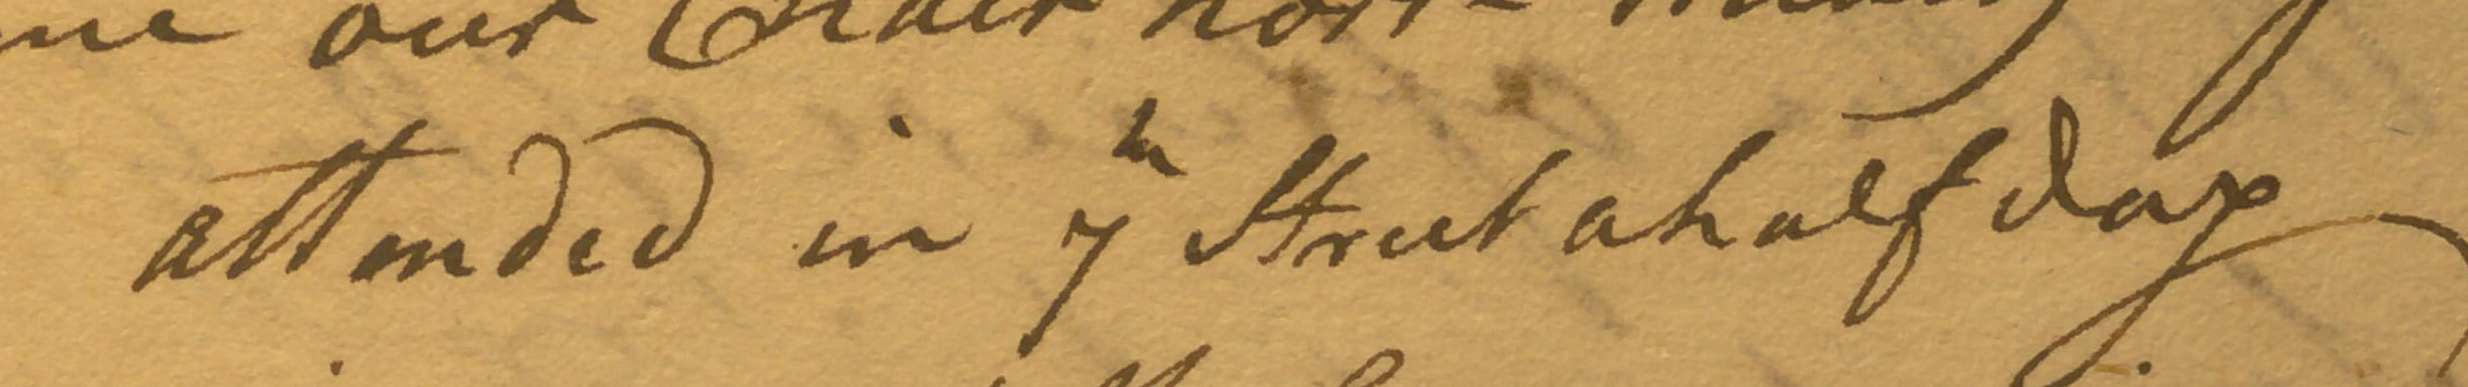attended in 7^th Street a half day,
